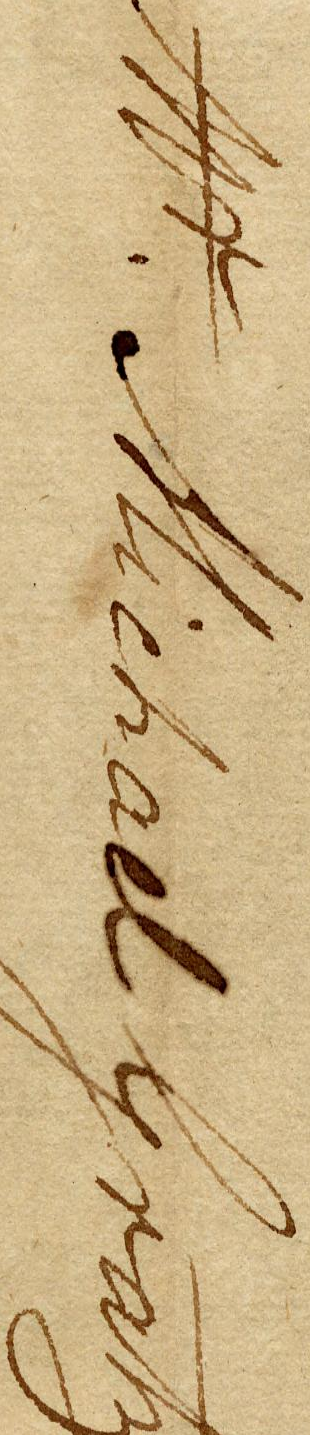M^r. Michael Gratz
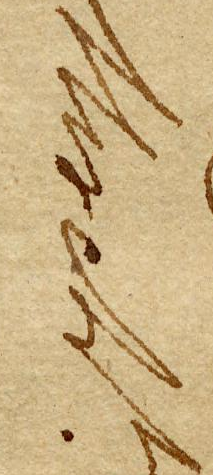Merch^t
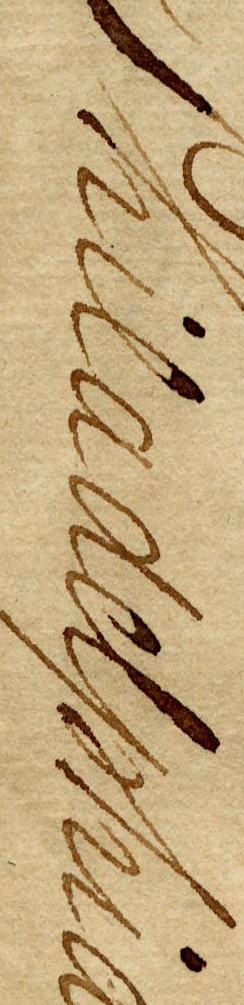Philadelphia
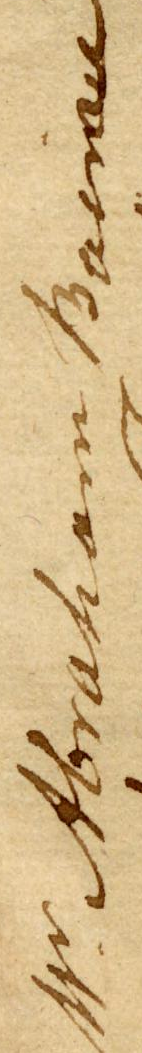M^r. Abraham Basrace
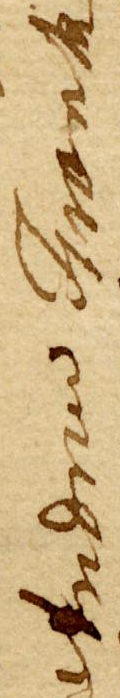Andrew Frank
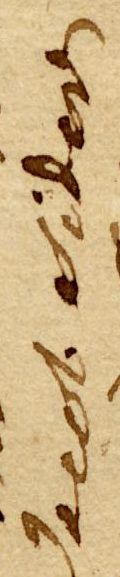Jacob Sider
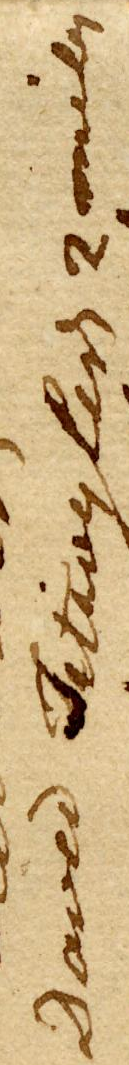David Tetivylers 2 mills
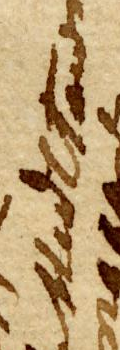Midltown
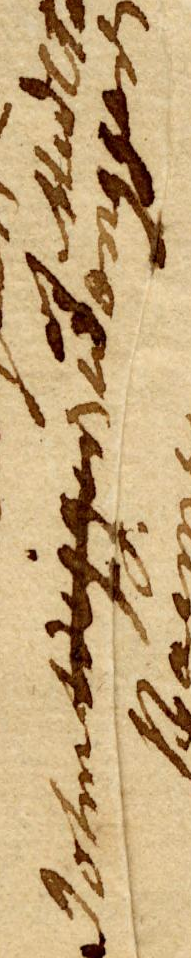John [Wiggins] Wanggers
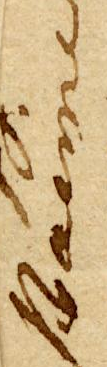Raise
